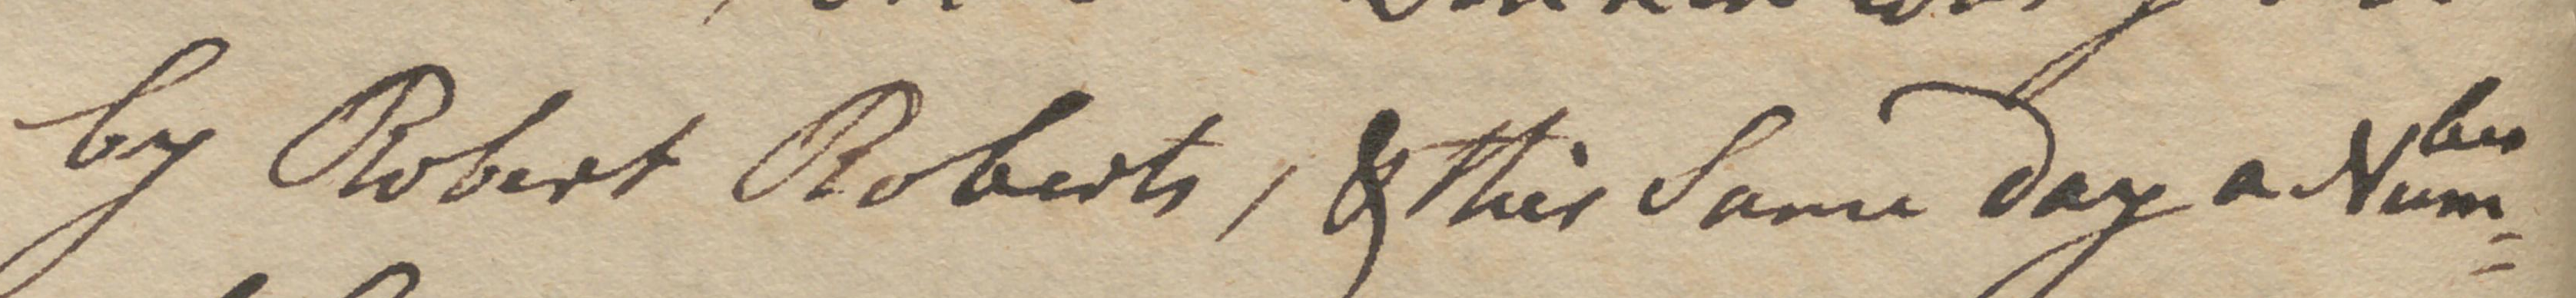by Robert Roberts, & this Same day a Num-
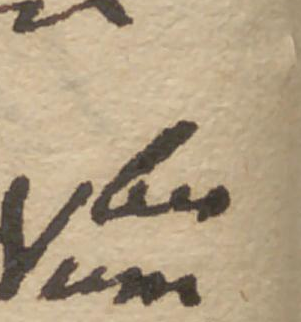ber
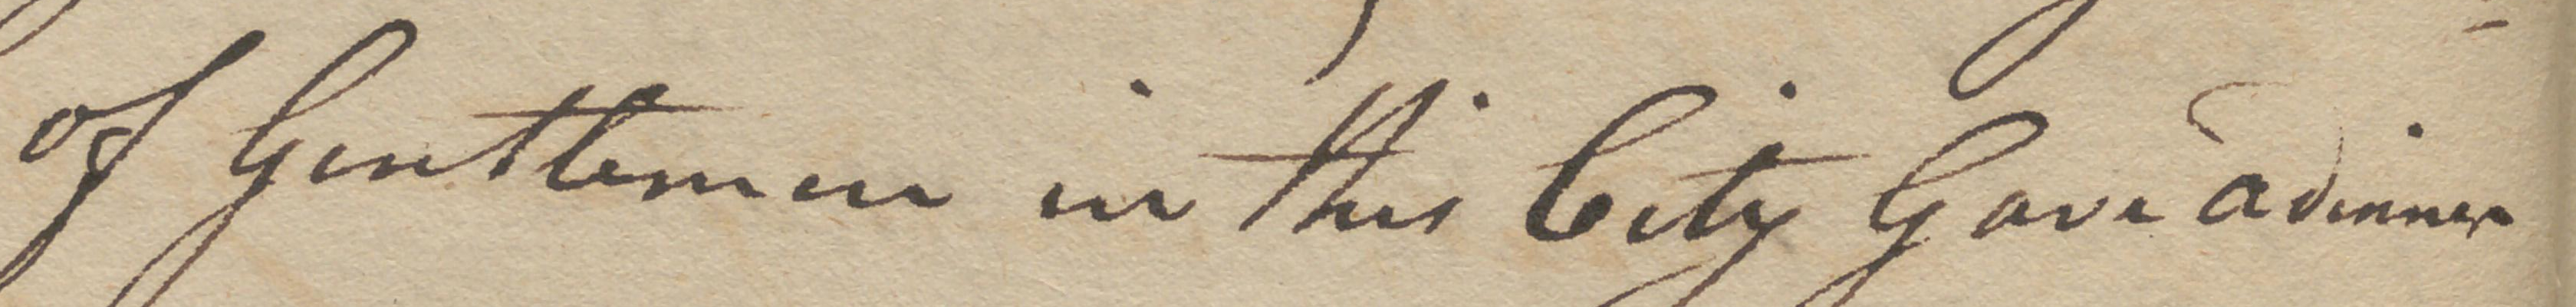of Gentlemen in this City Gave a dinner
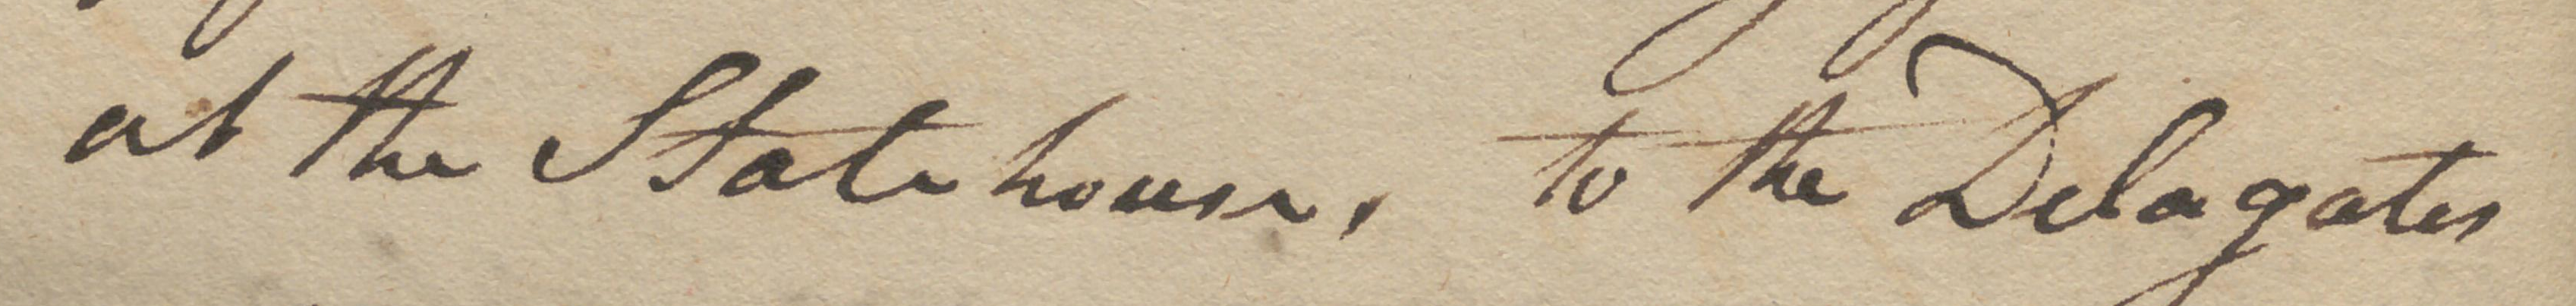at the Statehouse, to the Delagates
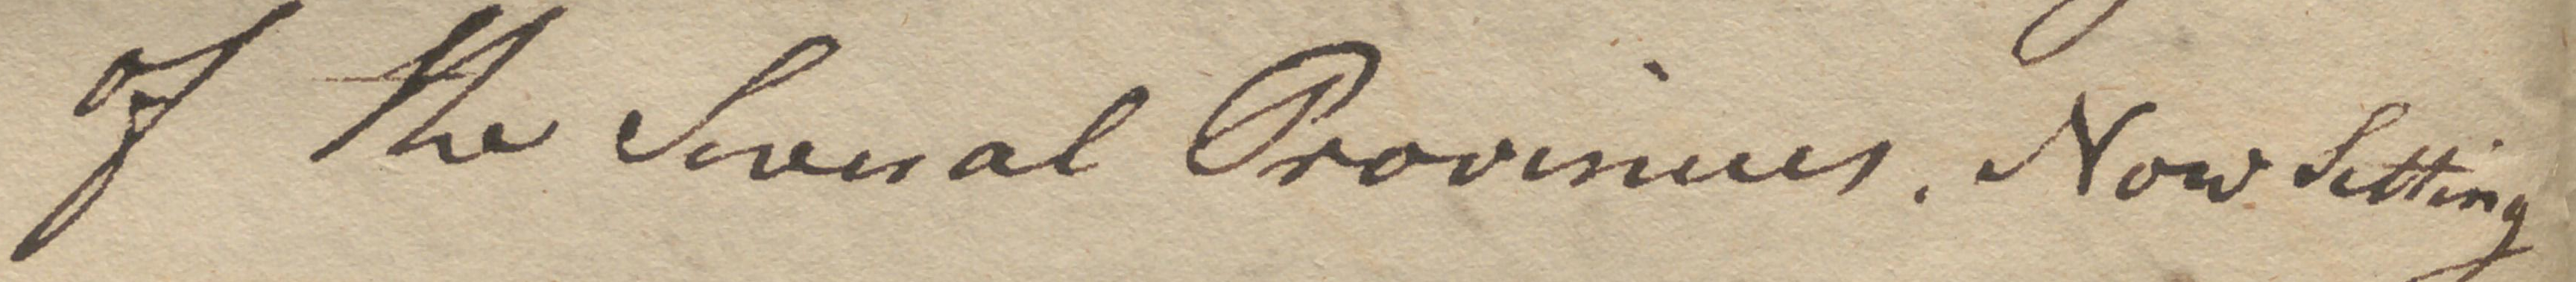o the Several Provinces, Now Setting
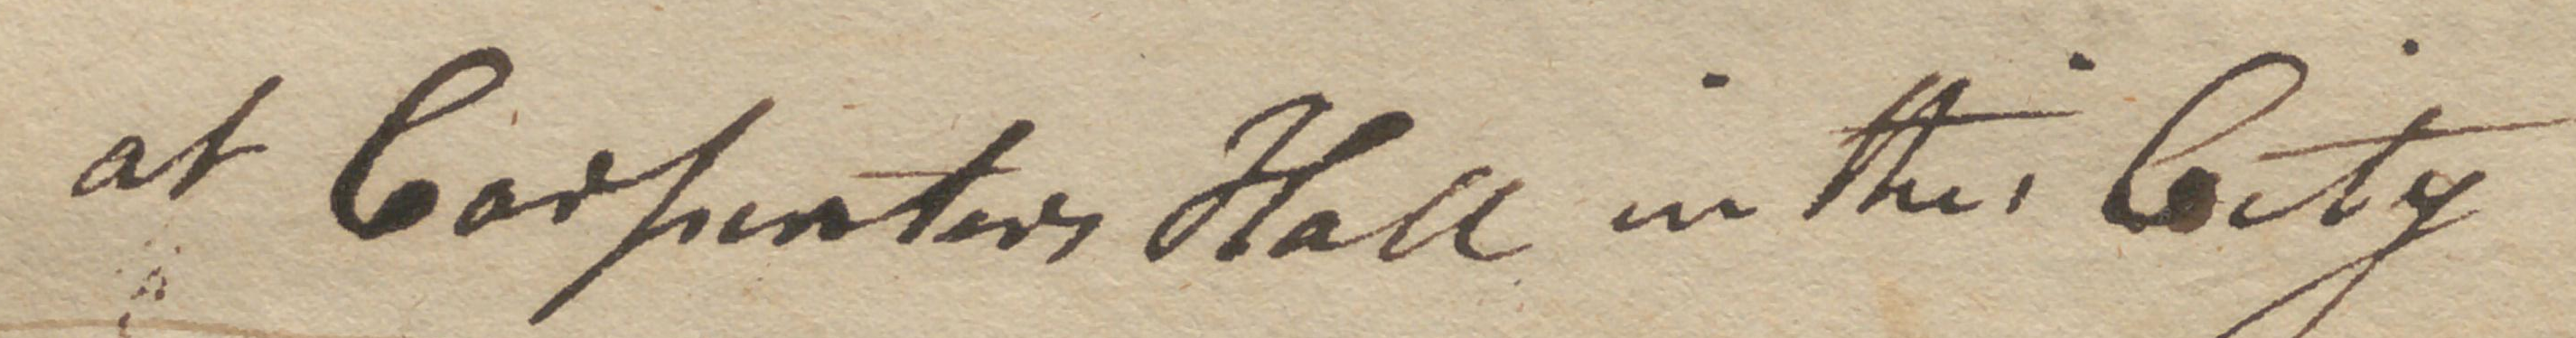at Carpenters Hall in this City
